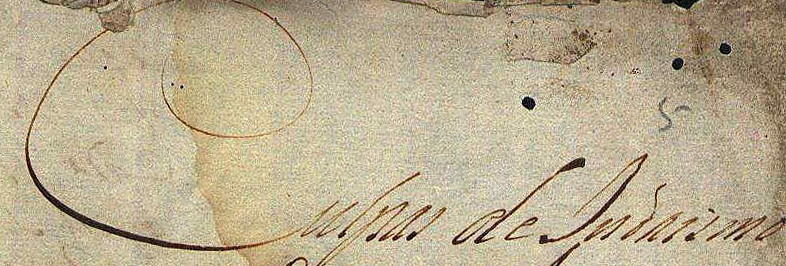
Culpas de Iudaismo
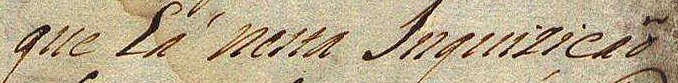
que há nesta Inquiziçaõ
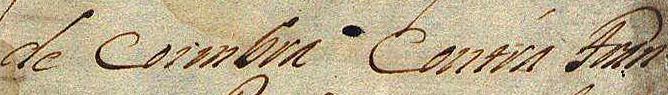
de coimbra contra Fran
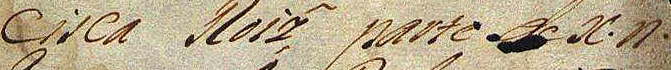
cisca Roiz̄, parte de x.n.
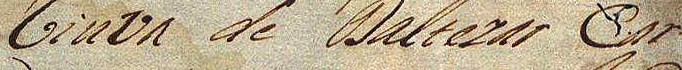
Viuva de Baltezar Car
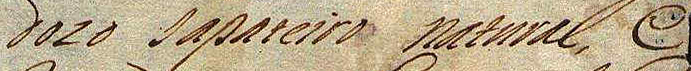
dozo sapateiro natural, e
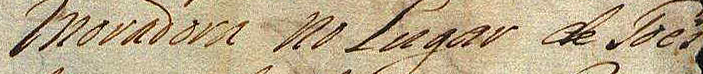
moradora no Lugar de Toes
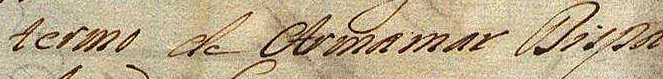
termo de Armamar Bispa
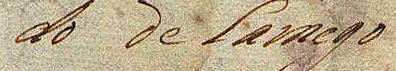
do de Lamego
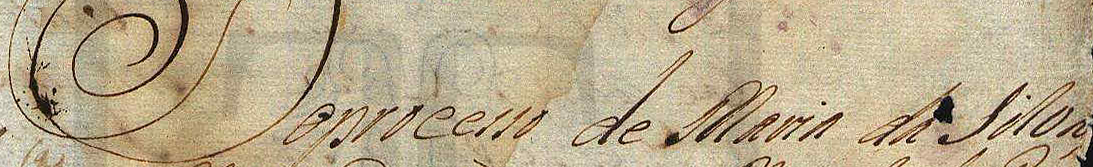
Do processo de Maria da Silva,
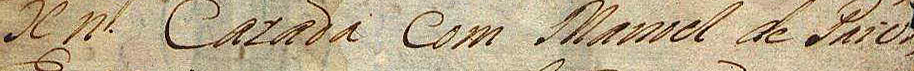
xn. cazada com Manoel de Paiv_,
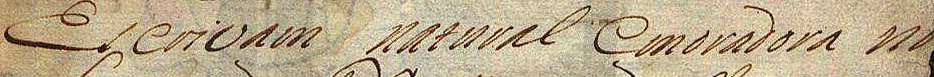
Escrivam natural e moradora no
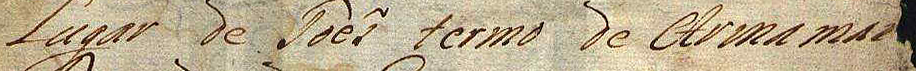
Lugar de Toez̄ termo de Armamar
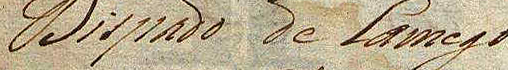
Bispado de Lamego
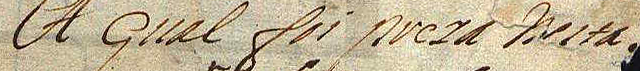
A qual foi preza nesta I
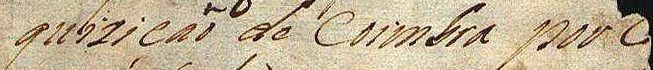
quiziçaõ de coimbra por
